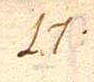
17.
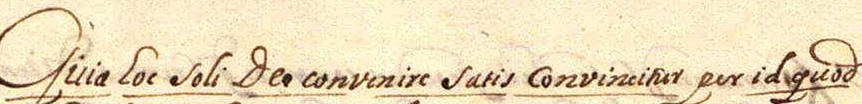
Quia hoc soli Deo convenire satis convincitur per idquod
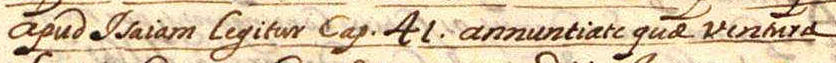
apud Isaiam legitur Cap. 41. annuntiate quæ ventura
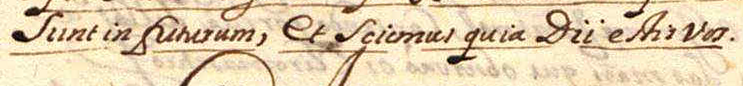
sunt in futurum, et sciemus quia Dii estis vos.
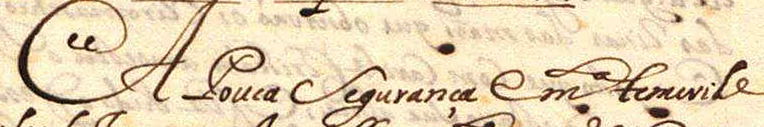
A Pouca Segurança e m.to temeride
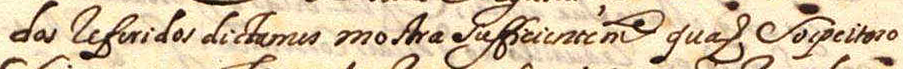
dos Referidos dictames mostra sufficientemte quaõ Sospeitoso
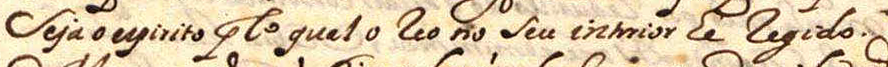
Seja o espirito plo qual o Reo no seu interior hé Regido.
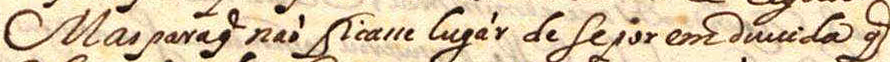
Mas para q̄ naõ ficasse lugar de se por em duuida q̄
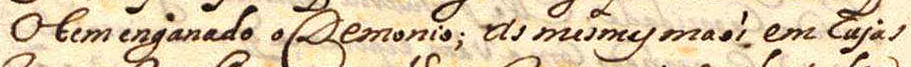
O tem enganado o Demonio; as mesmas maõs em cujas
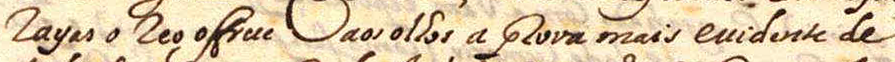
Rayas o Reo offrece aos olhos a pRova mais euidente de
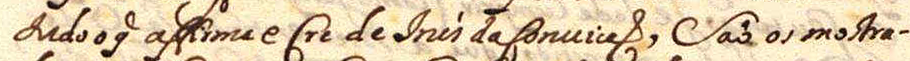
tudo o q̄ affirma, e Cre de Ines da Conceiçaõ, Saõ os mostra
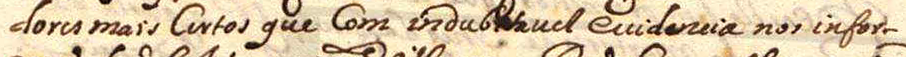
dores mais Certos que Com indubitauel euidencia nos infor
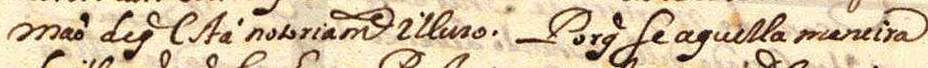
maõ de q̄ Está notoriamte illuzo. Porq̄ se aquella maneira
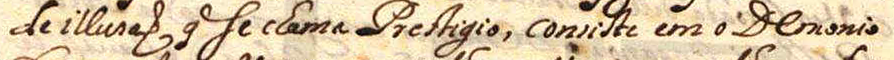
de illusaõ, q̄ se chama Prestigio, consiste em o Demonio
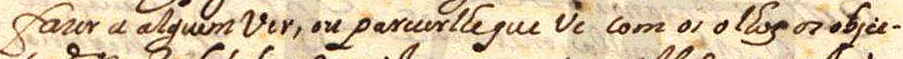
fazer a alguem ver, ou parecerlhe que ve com os olhos os objec
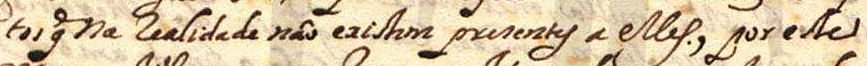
tos q̄ na Realidade naõ existem presentes a elles, por este
